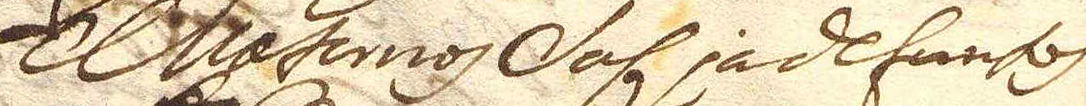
e Maternos Saꝭ ja defuntos
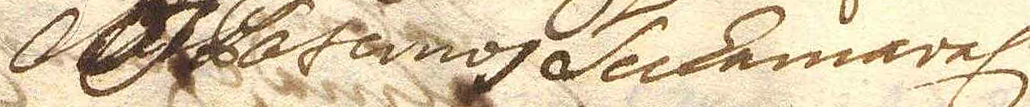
e Os Paternos se chamavaꝭ
